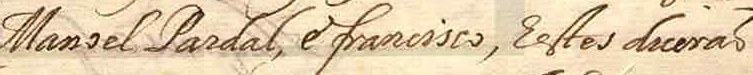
Manoel Pardal, e francisco, E estes diceraõ
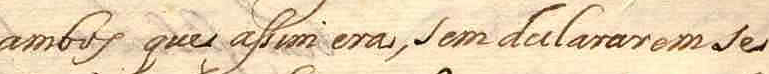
ambos que assim era, sem declararem se
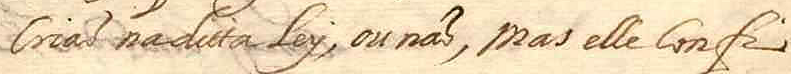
criaõ na ditta Ley, ou naõ, mas elle confi
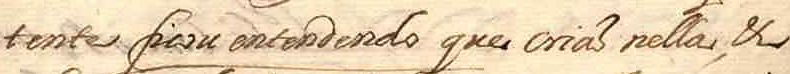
tente ficou entendendo que criaõ nella, E
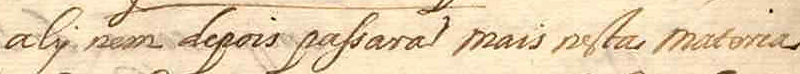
aly nem depois passaraõ mais nesta materia
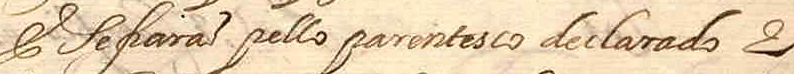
E se fiaraõ pello parentesco declarado E
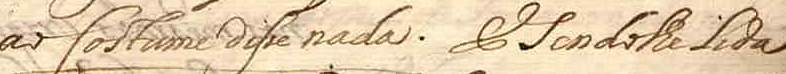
ao Costume disse nada. E Sendolhe Lida
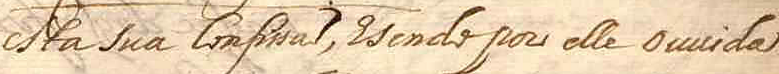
esta sua Confissaõ, E sendo por elle ouuida
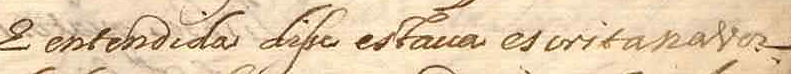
E entendida disse estaua escrita na ver
